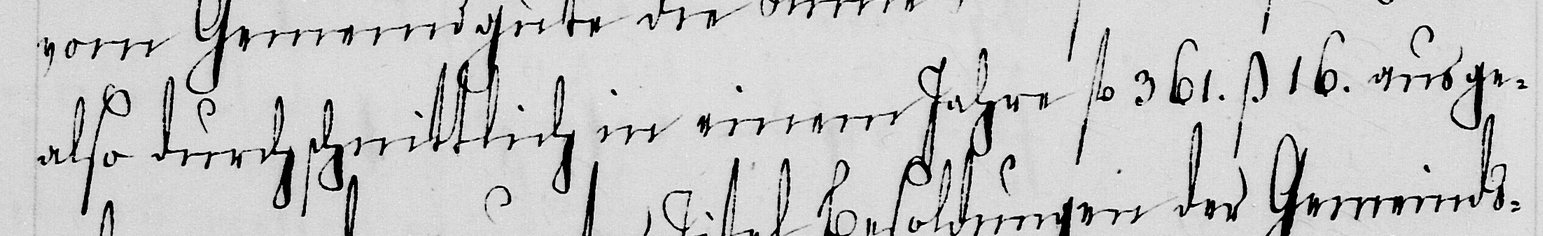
also durchschnittlich in einem Jahre fl. 361. ß. 16. ausge¬
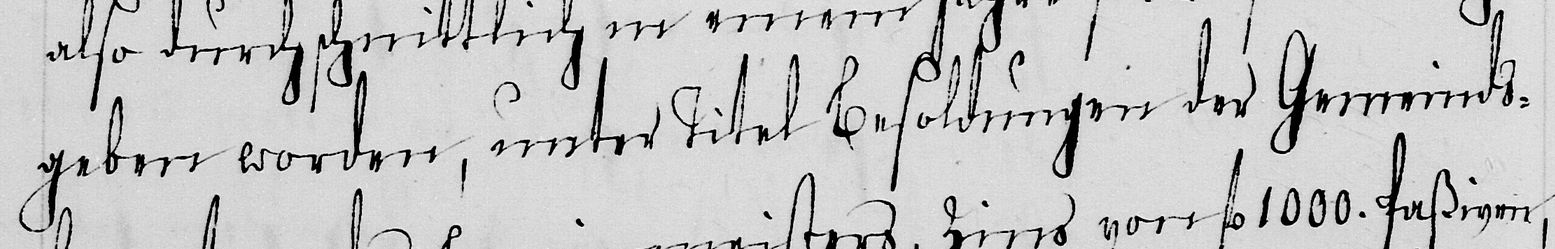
geben worden, unter Titel Besoldungen der Gemeinds¬
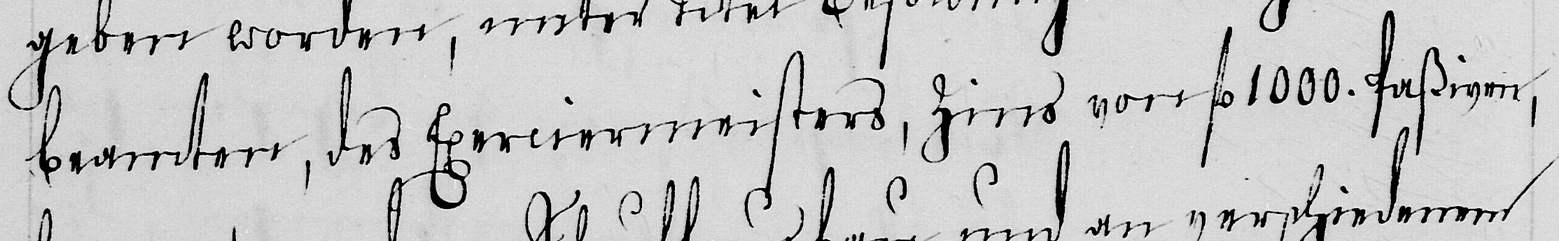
beamten, des Exerciermeisters, Zins von fl. 1000. Paßiven,
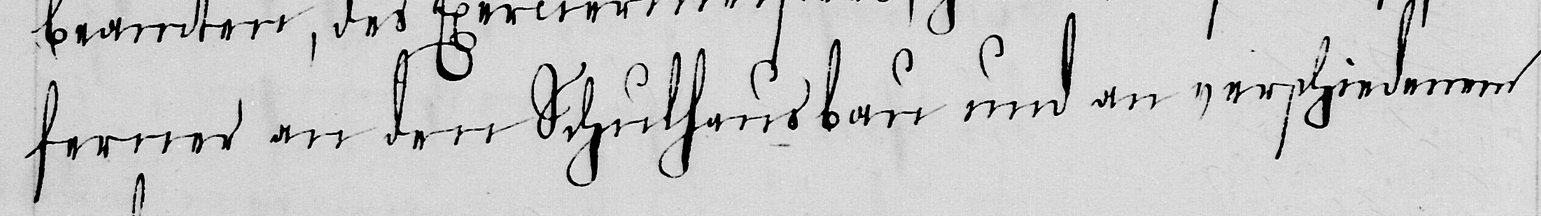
ferner an den Schulhausbau und an verschiedenen
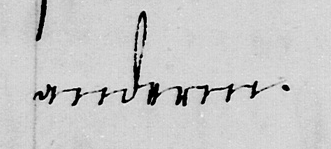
andern.
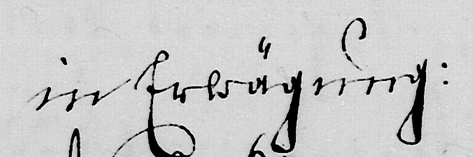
in Erwägung:
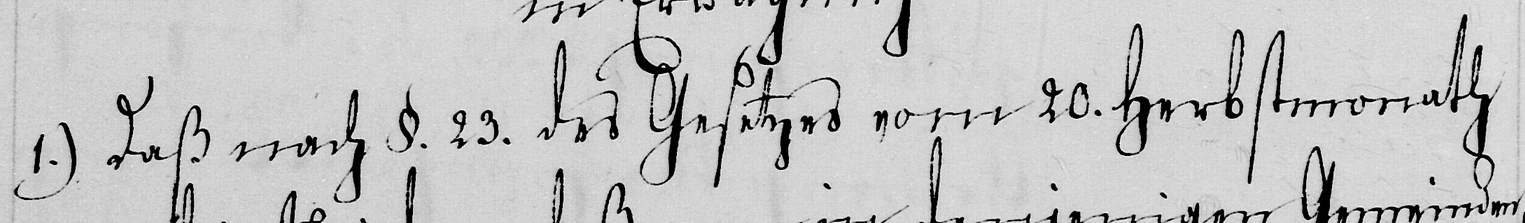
1.) Daß nach §. 23. des Gesetzes vom 20. Herbstmonath
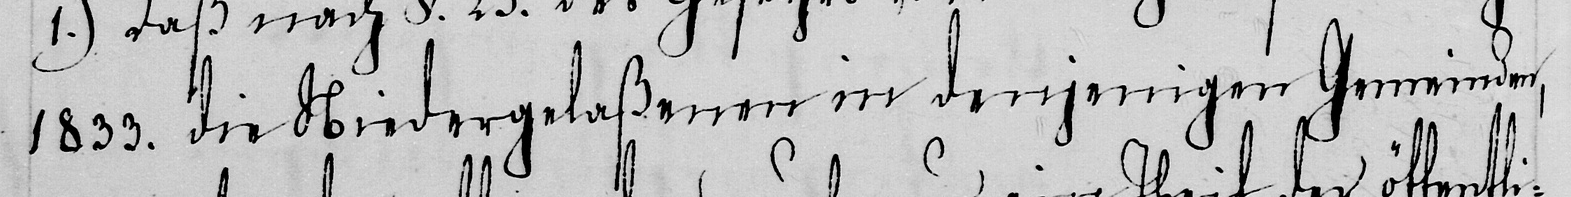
1833. die Niedergelaßenen in denjenigen Gemeinden,
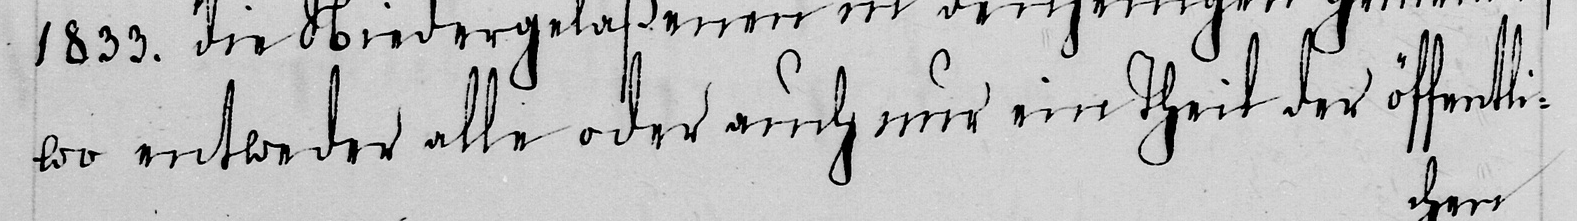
wo entweder alle oder auch nur ein Theil der öffentli-
